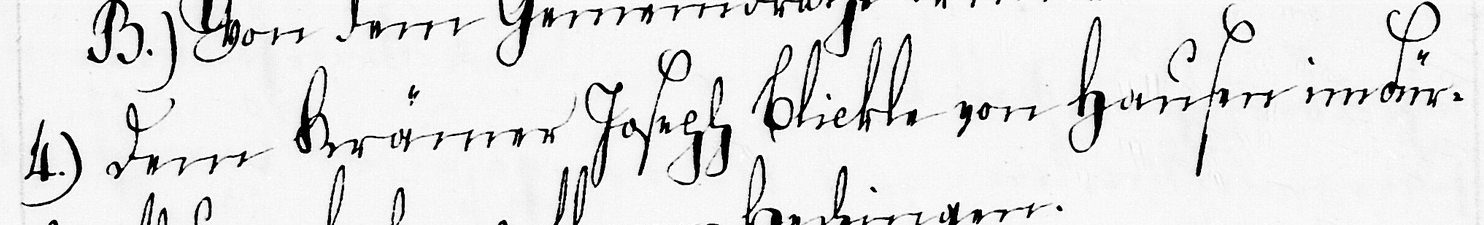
4.) Dem Krämer Joseph Blickle von Hausen im Für¬
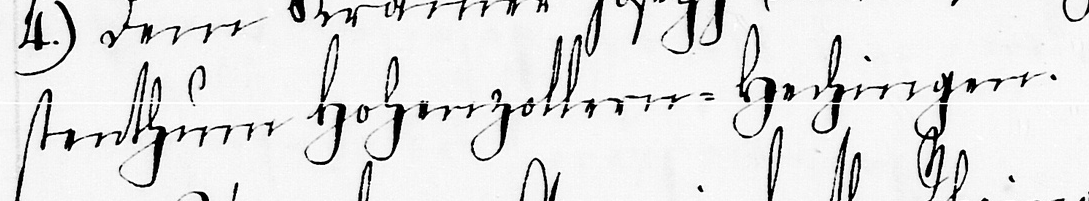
stenthum Hohenzollern-Hechingen.
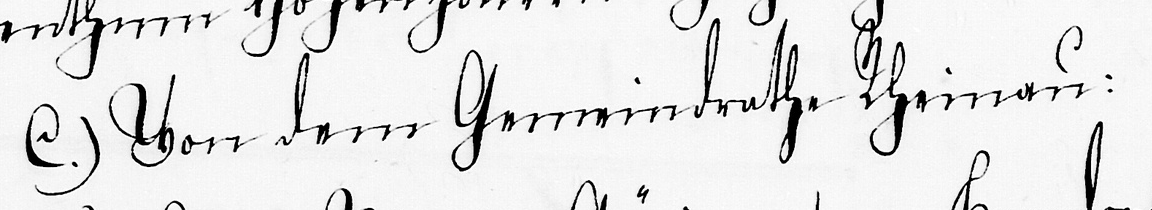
C.) Von dem Gemeindrathe Rheinau:
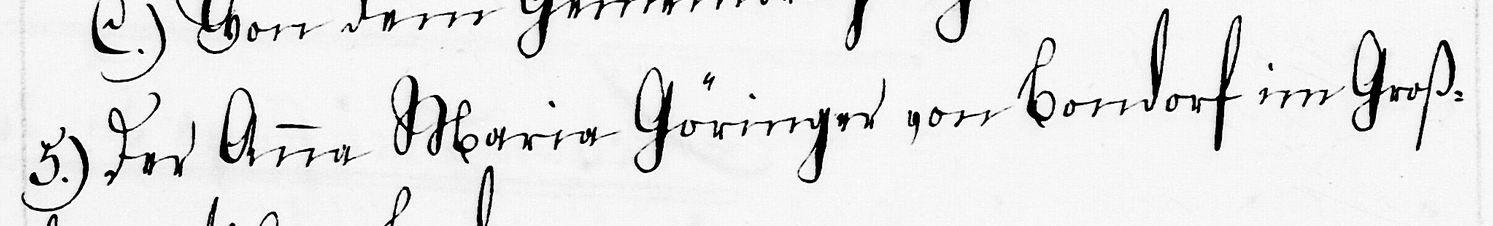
5.) Der Anna Maria Göringer von Bondorf im Groß¬
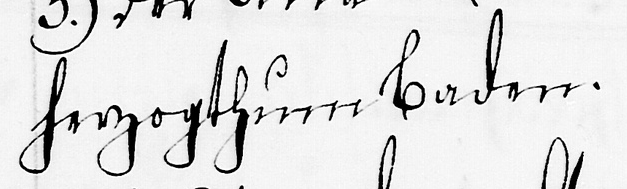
herzogthum Baden.
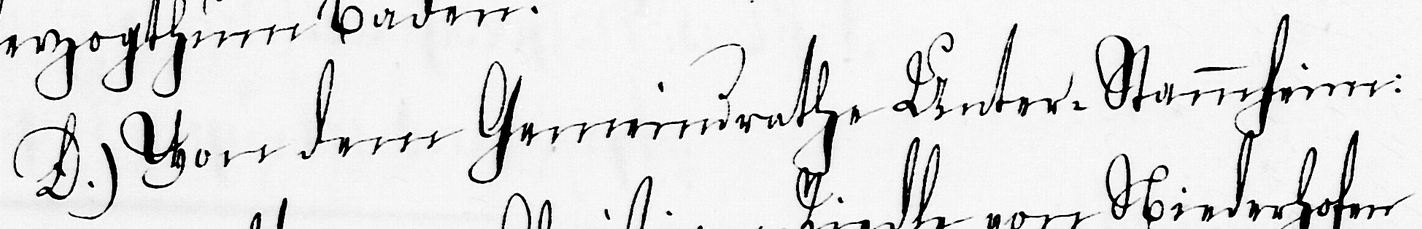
D.) Von dem Gemeindrathe Unter-Stammheim:
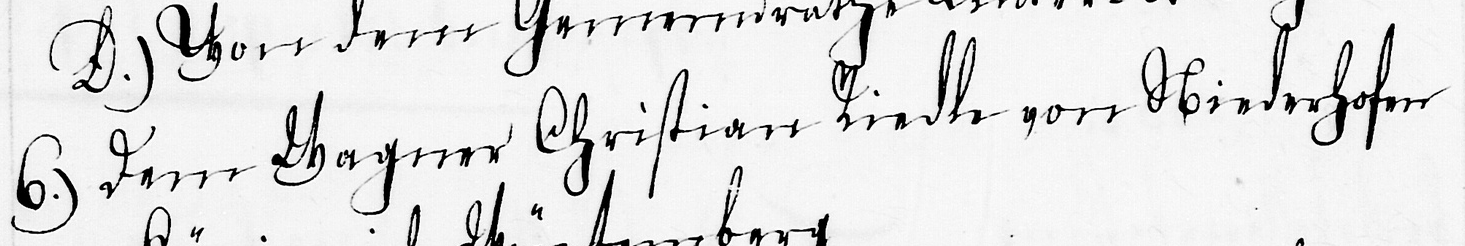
6.) Dem Wagner Christian Riedle von Niederhofen
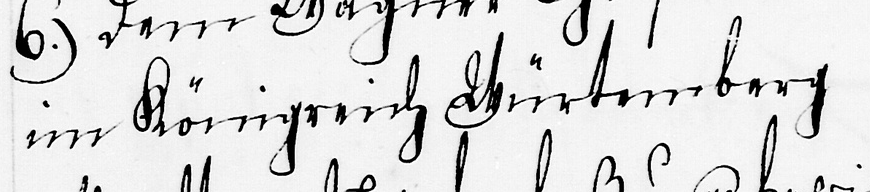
im Königreich Würtemberg
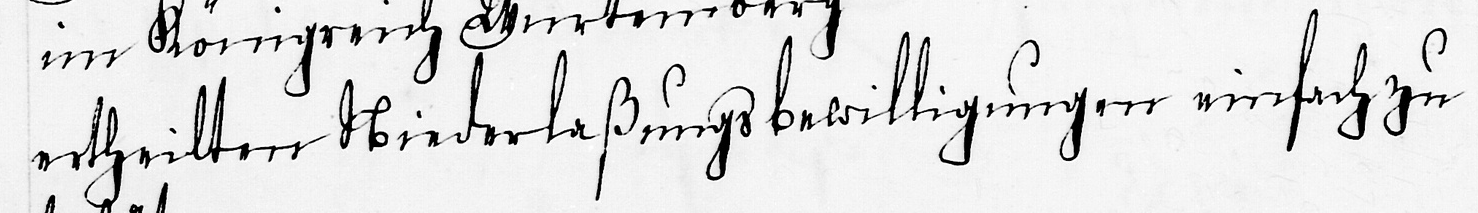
ertheilten Niederlaßungsbewilligungen einfach zu
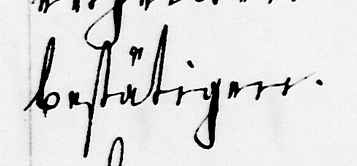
bestätigen.
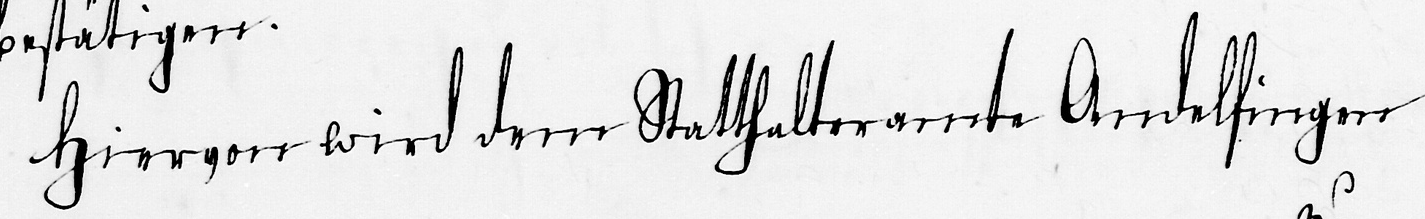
Hiervon wird dem Statthalteramte Andelfingen
